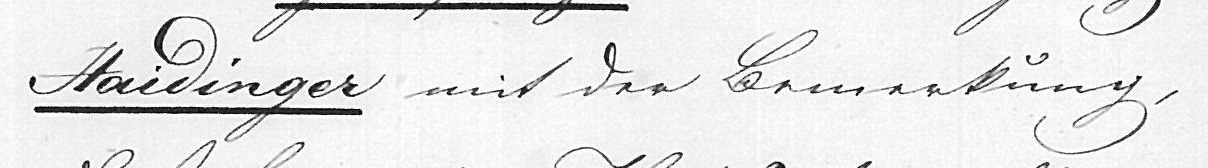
Haidinger mit der Bemerkung,
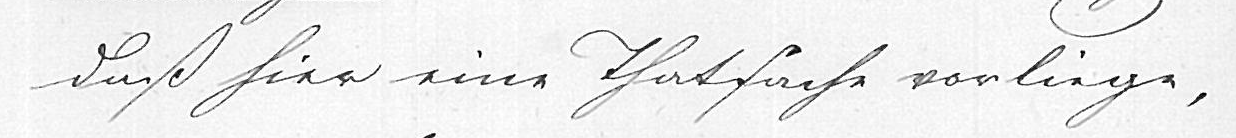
daß hier eine Thatsache vorliege,
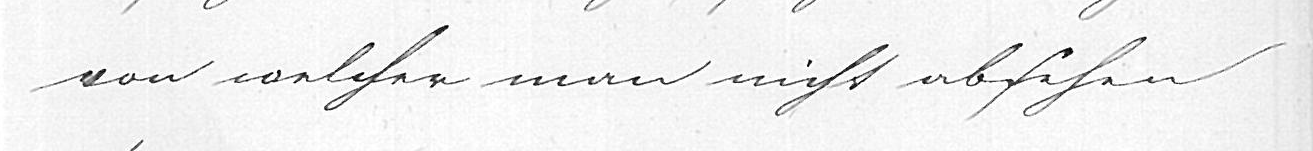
von welcher man nicht absehen
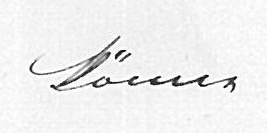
könne.
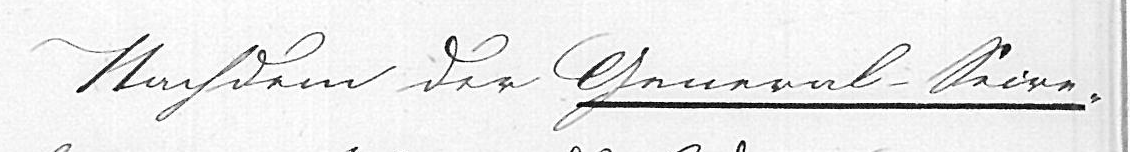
Nachdem der General-Secre-
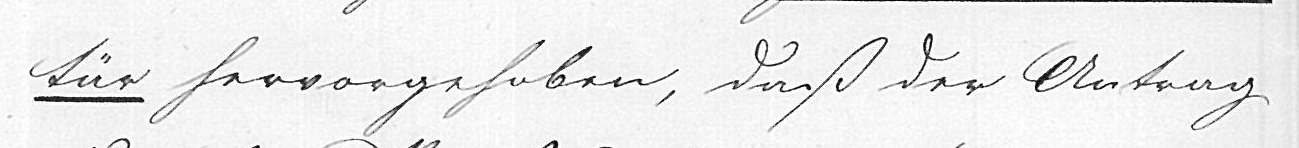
tär hervorgehoben, daß der Antrag
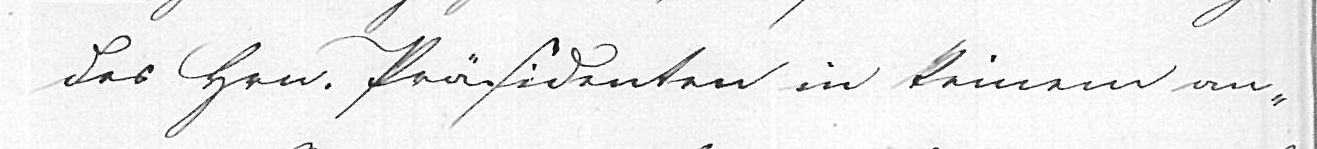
des Hrn. Präsidenten in keinem an-
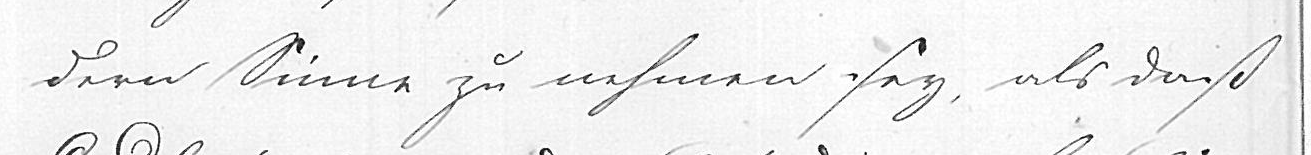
dern Sinne zu nehmen sey, als daß
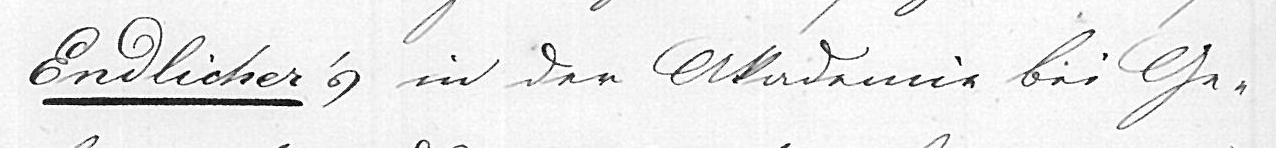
Endlicher's in der Akademie bei Ge-
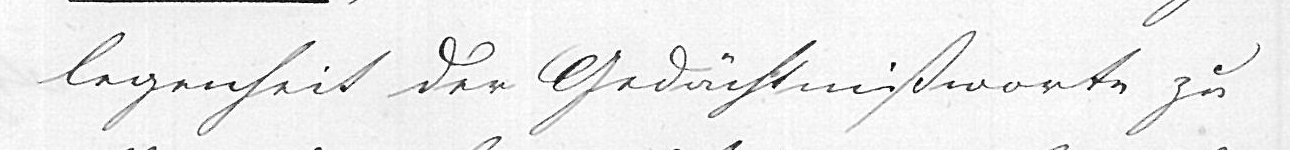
legenheit der Gedächtnißworte zu
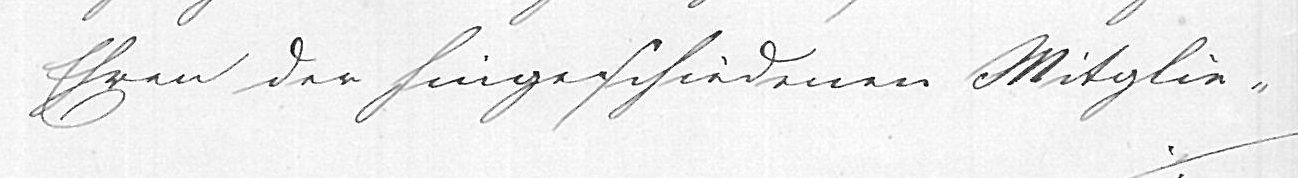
Ehren der hingeschiedenen Mitglied-
